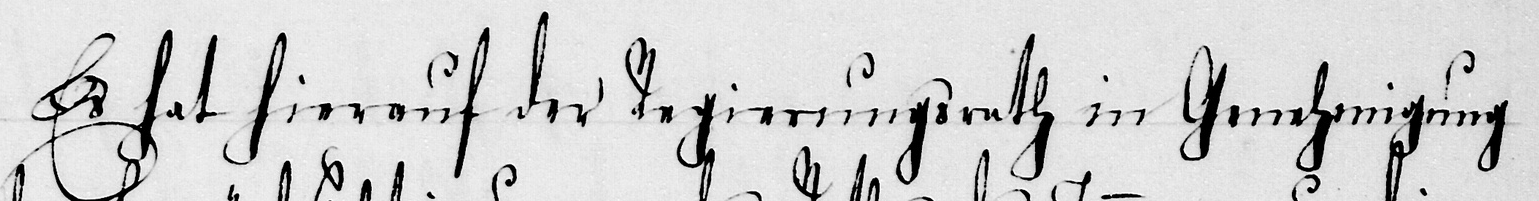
Es hat hierauf der Regierungsrath in Genehmigung
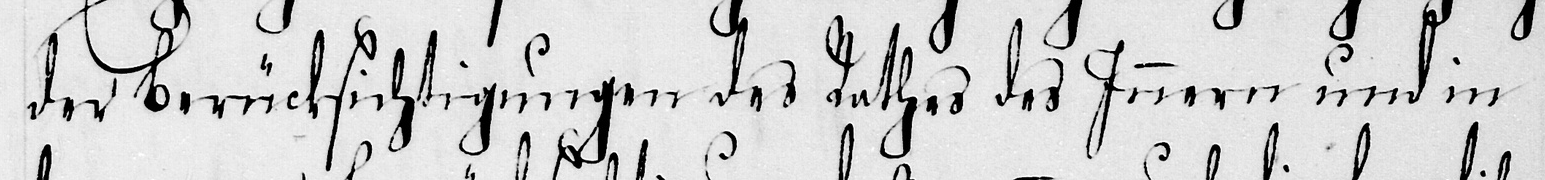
der Berücksichtigungen des Rathes des Innern und in
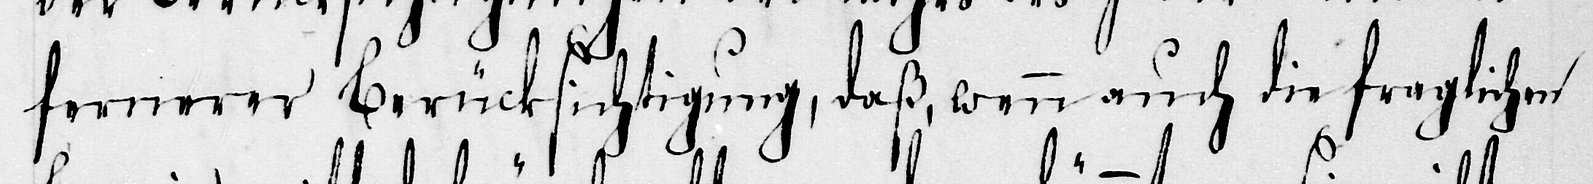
fernerer Berücksichtigung, daß, wenn auch die fraglichen
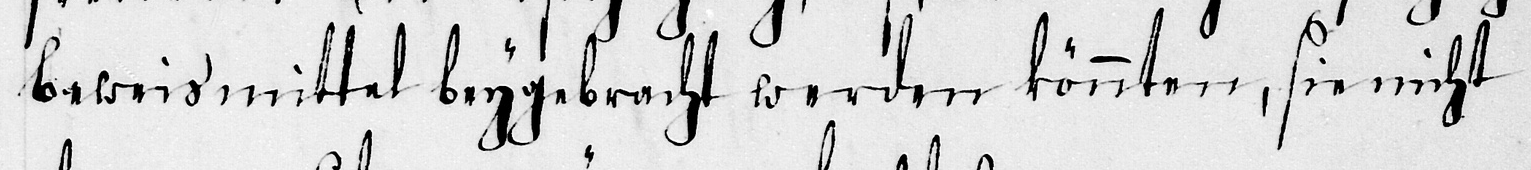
Beweismittel beygebracht werden könnten, sie nicht
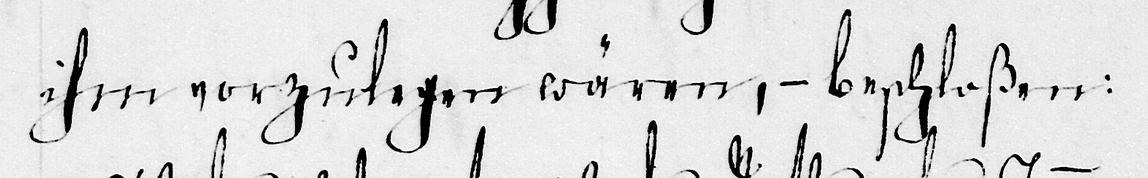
ihm vorzulegen wären, – beschloßen:
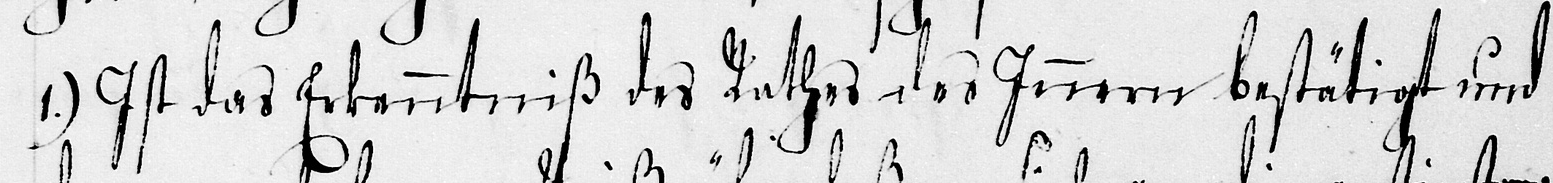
1.) Ist das Erkenntniß des Rathes des Innern bestätigt und
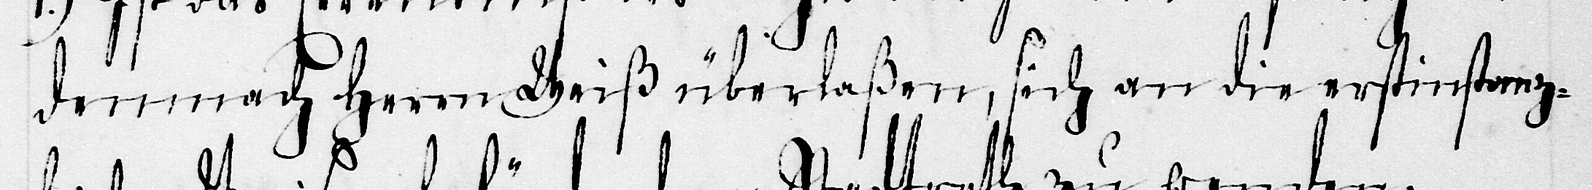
demnach Herrn Weiß überlaßen, sich an die erstinstanz¬
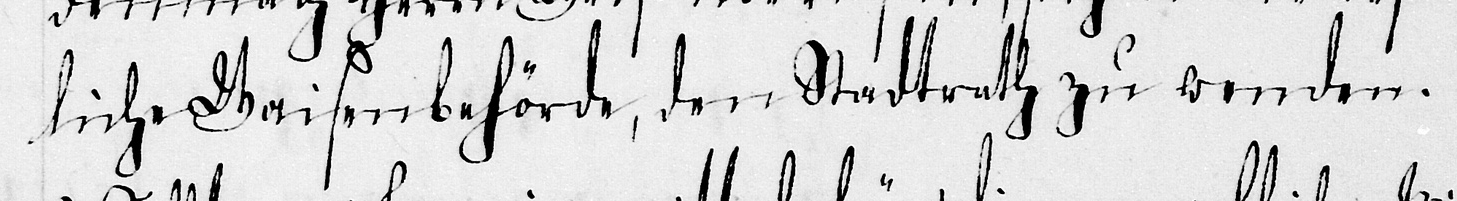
liche Waisenbehörde, den Stadtrath zu wenden.
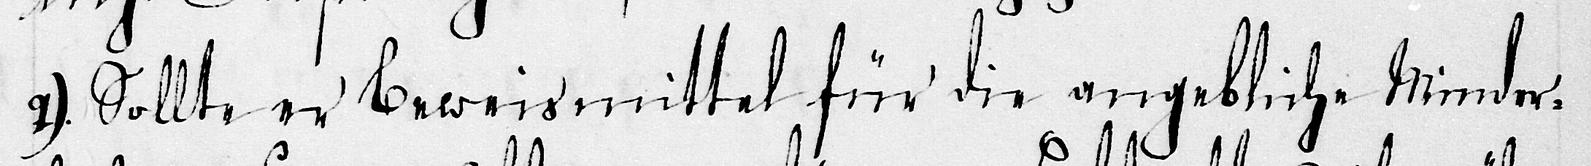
2.) Sollte er Beweismittel für die angebliche Minder¬
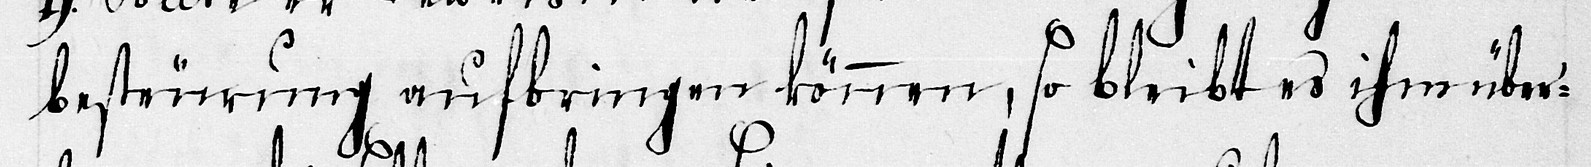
besteurung aufbringen können, so bleibt es ihm über¬
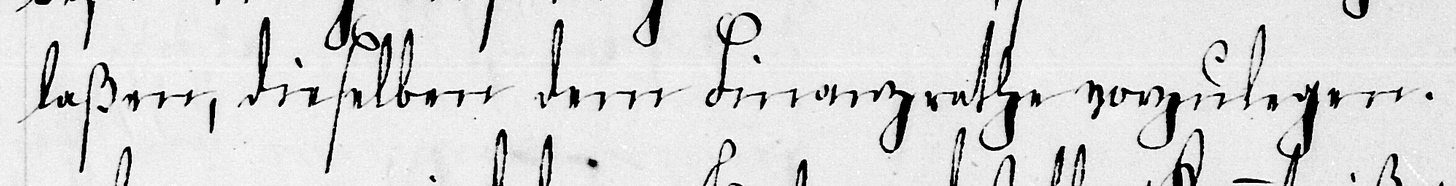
laßen dieselben dem Finanzrathe vorzulegen.
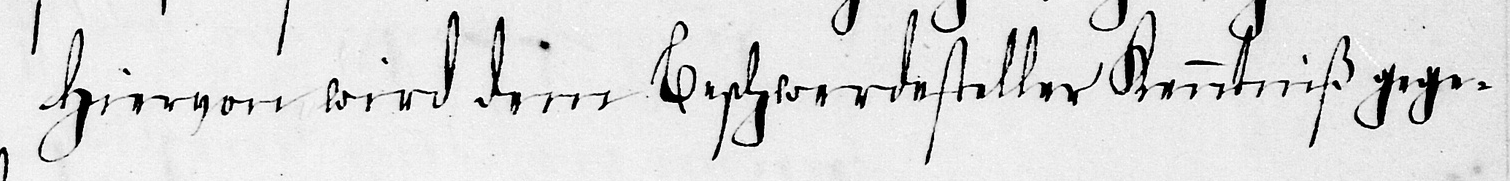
Hiervon wird dem Beschwerdesteller Kenntniß gege¬
